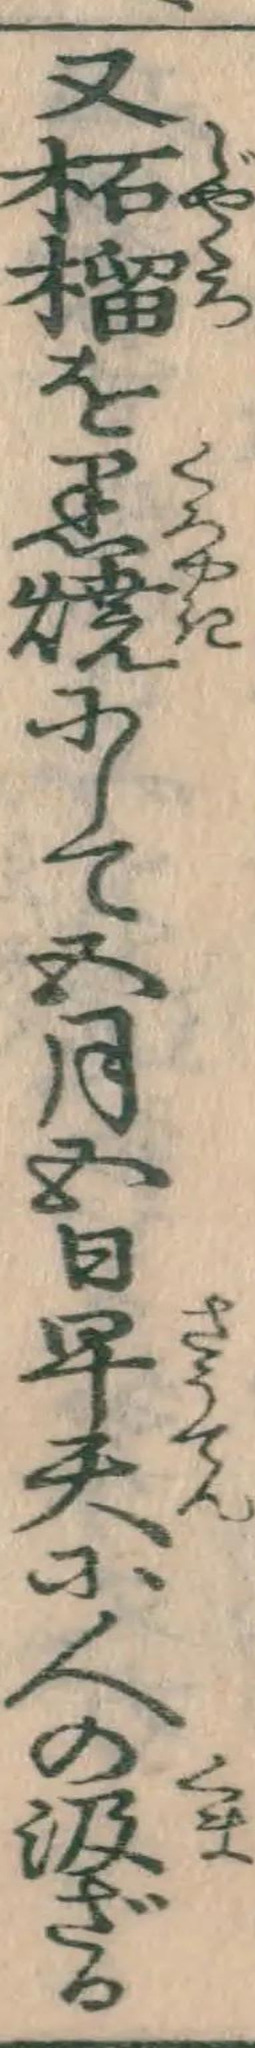又柘榴を黒焼にして五月五日早天に人の汲ざる
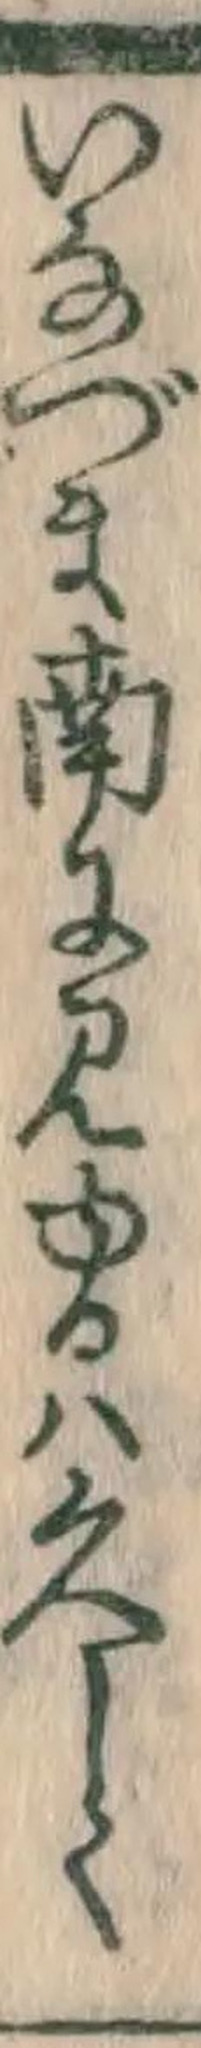いなづま南に見ゆるは久しく
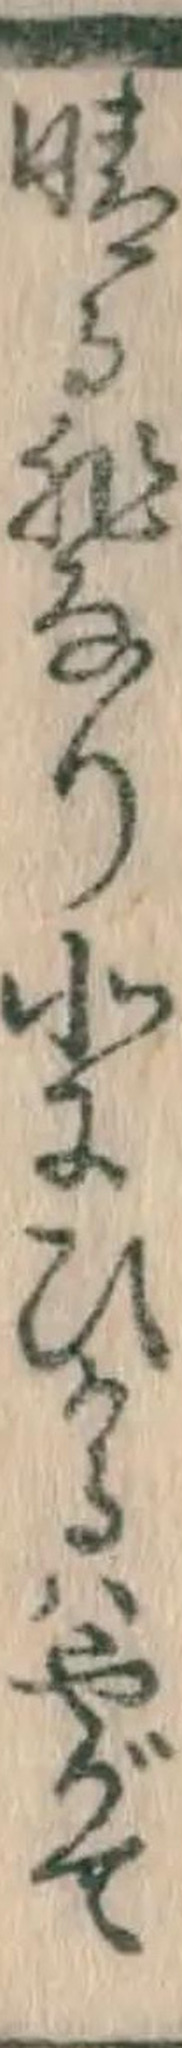晴る兆なり北にひかるはやがて
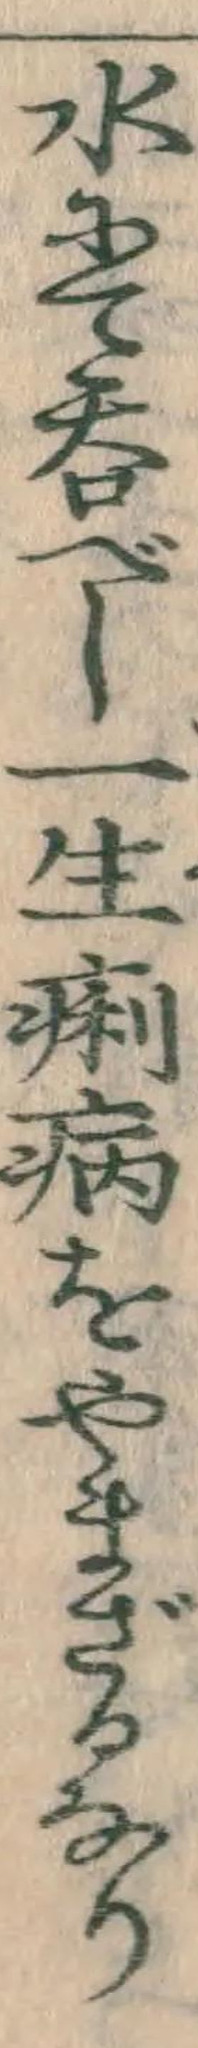水にて呑べし一生痢病をやまざるなり
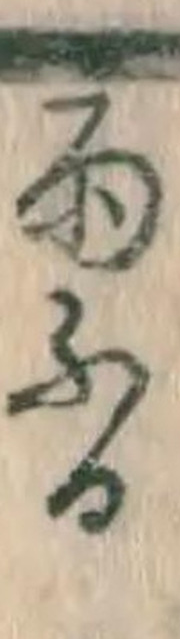雨ふる
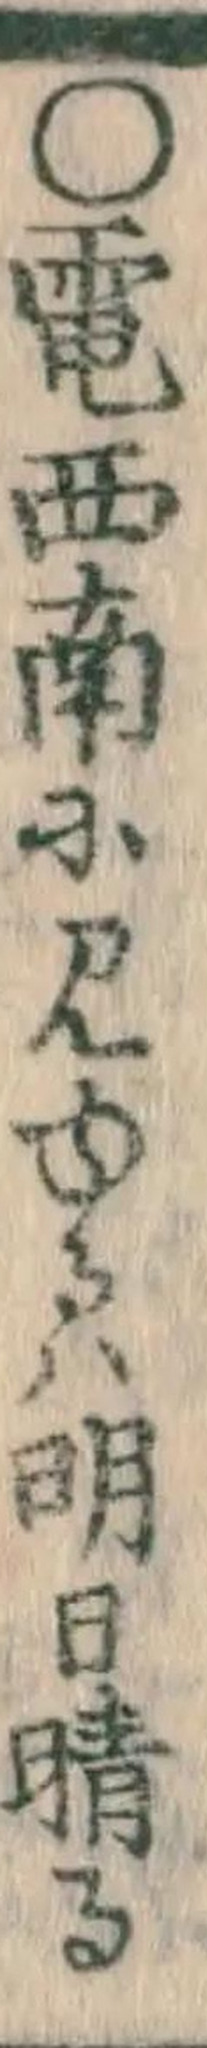○電西南に見ゆるは明日晴る
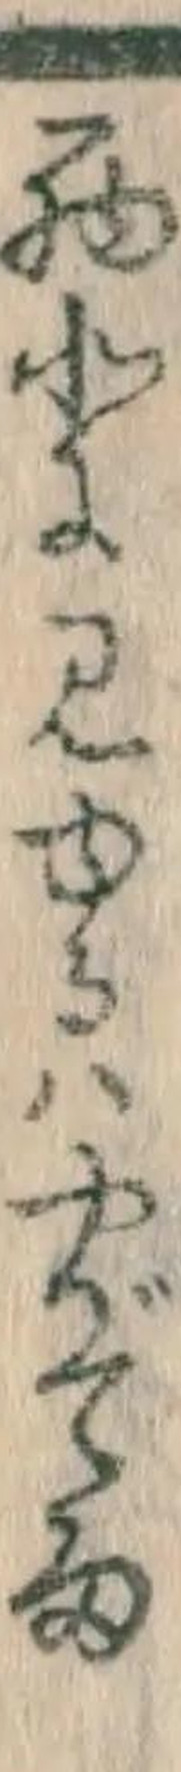西北に見ゆるはやがて雨
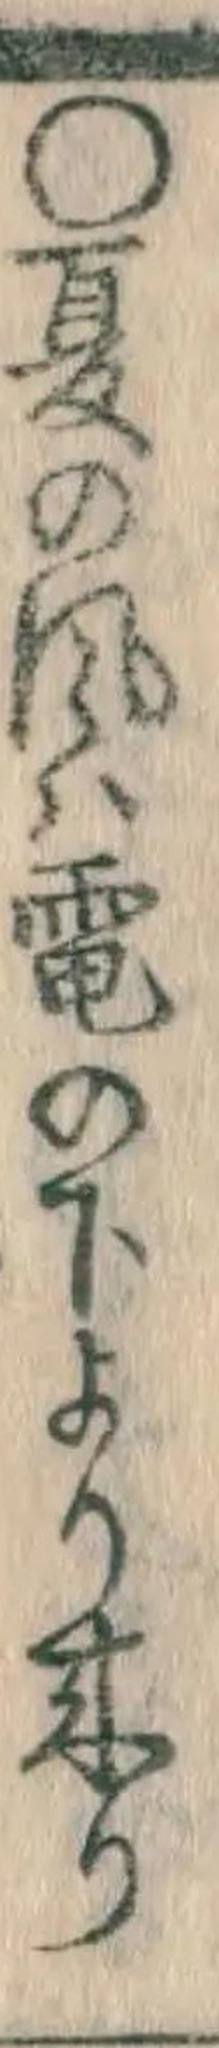○夏の風は電の下より来り
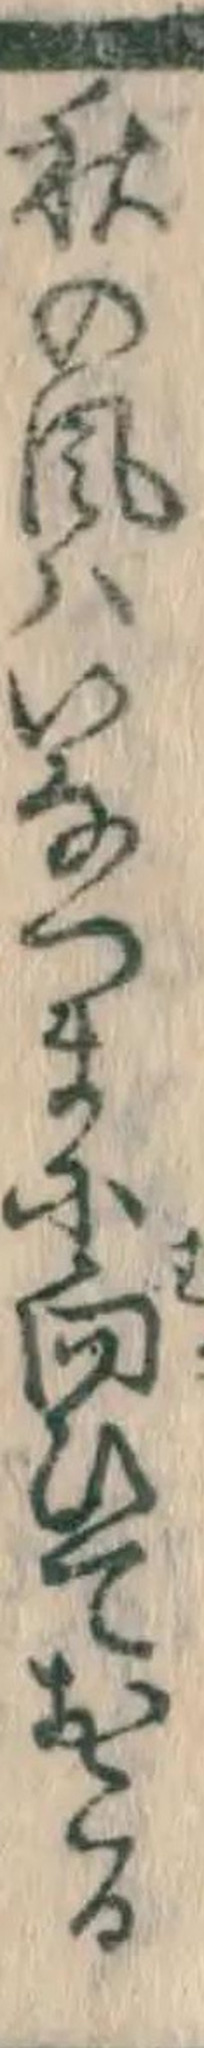秋の風はいなつまに向ひておこる
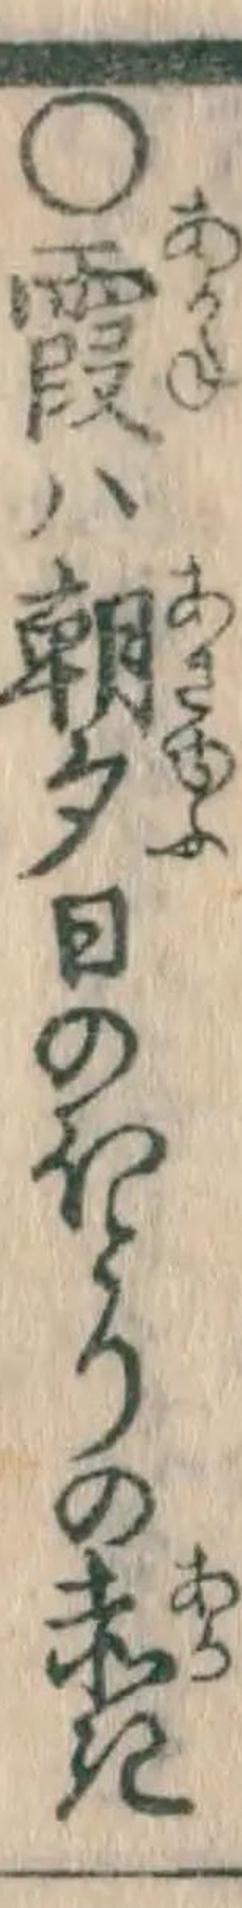○霞は朝夕日のほとりの赤き
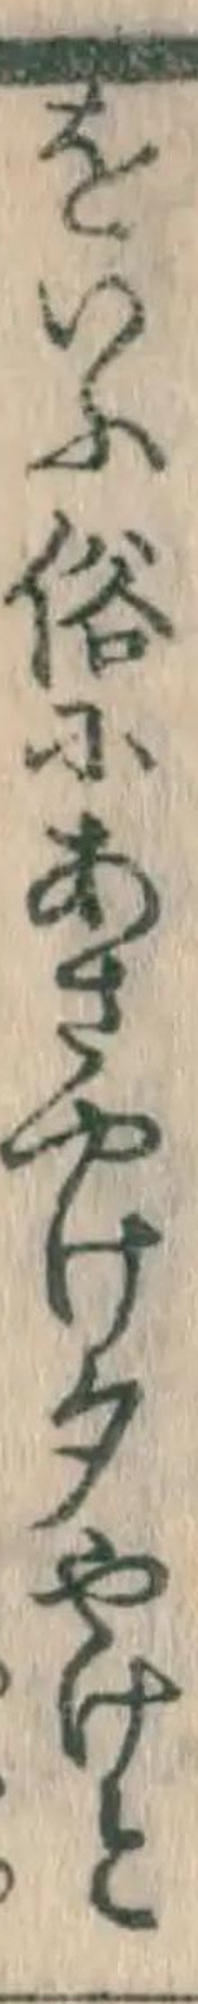をいふ俗にあさやけ夕やけと
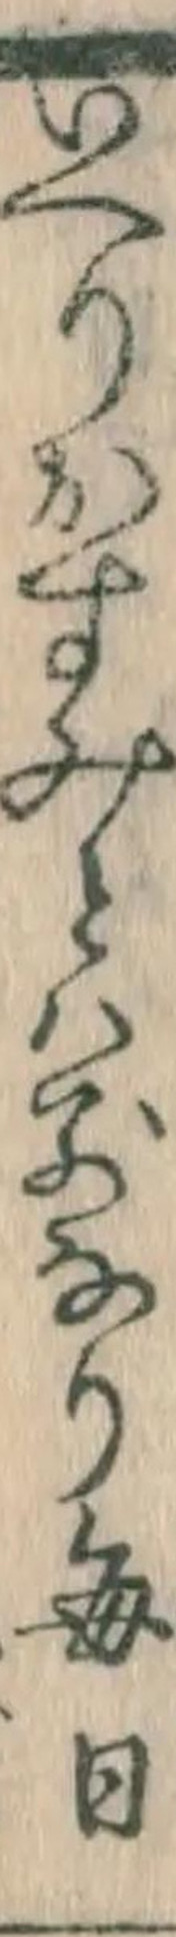いへりかすみとは別なり毎日
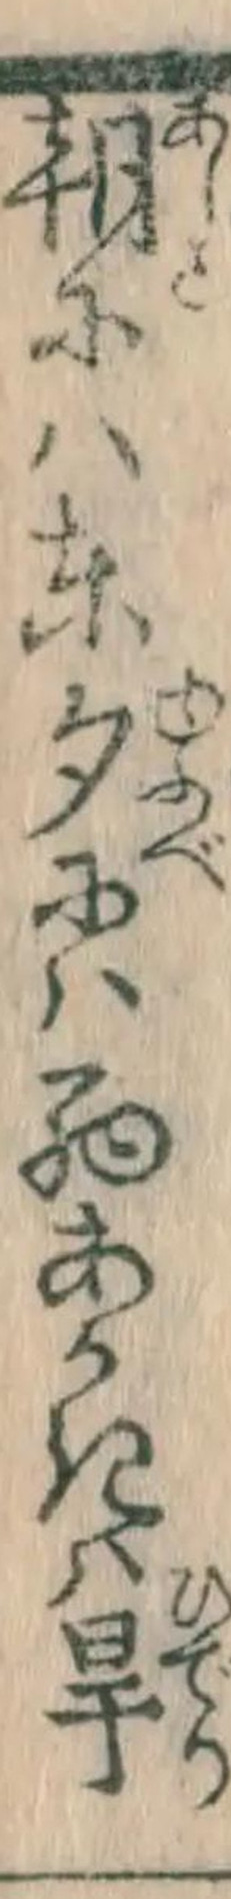朝には東夕には西あかきは旱

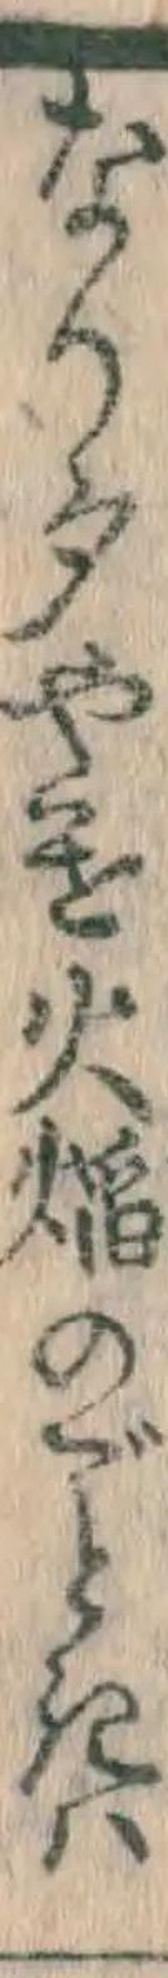なり夕やけ火焔のごときは
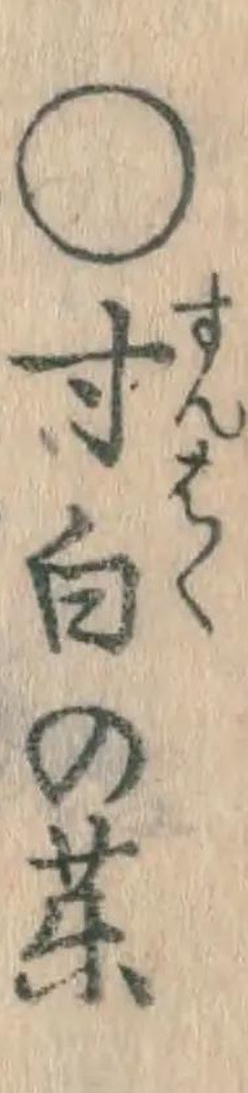○寸白の薬
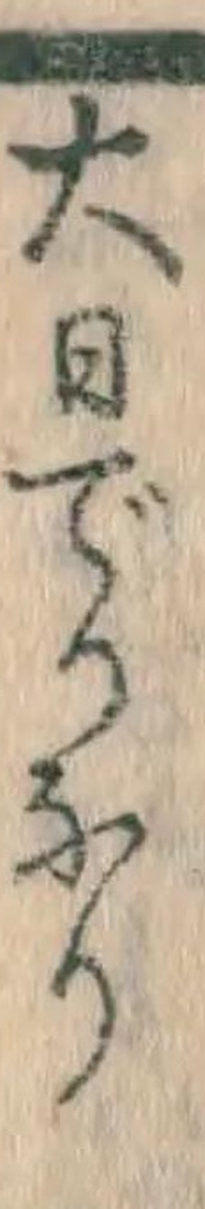大日でりなり
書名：広益秘事大全 3巻. [4]
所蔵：国立国会図書館 National Diet Library, JAPAN
